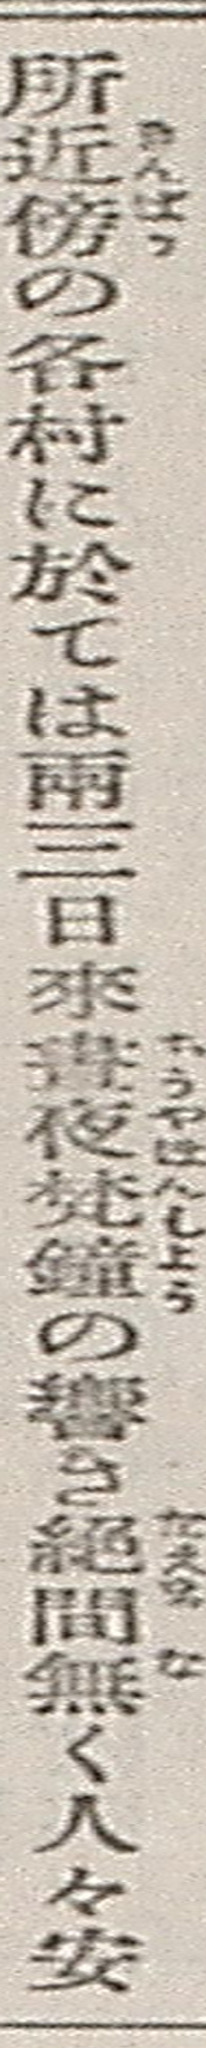所近傍の各村に於ては両三日来昼夜梵鐘の響き絶間無く人々安
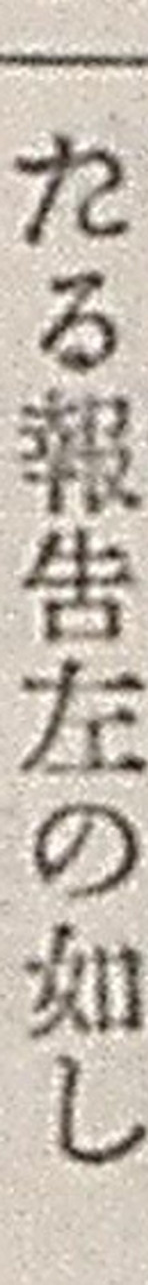たる報告左の如し
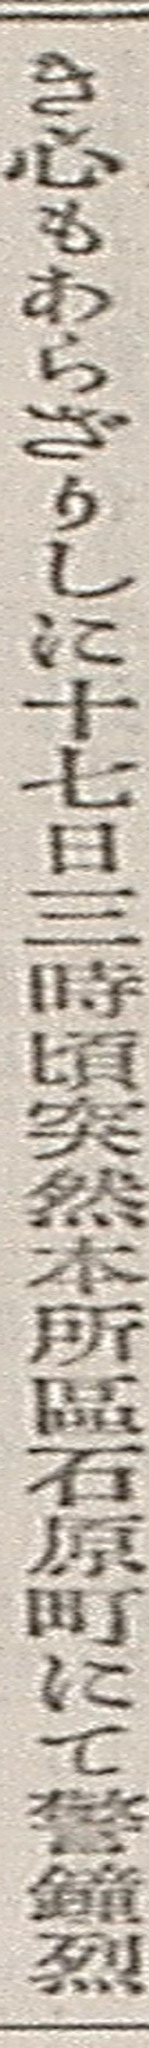き心もあらざりしに十七日三時頃突然本所区石原町にて警鐘烈
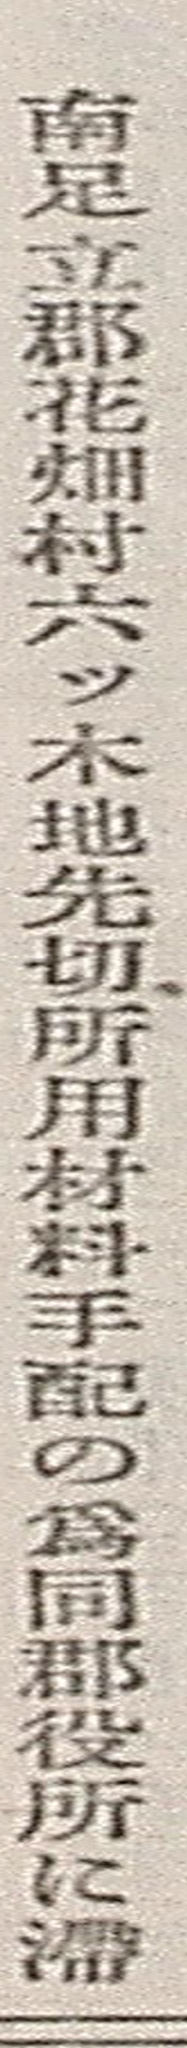南足立郡花畑村六ツ木地先切所用材料手配の為同郡役所に滞
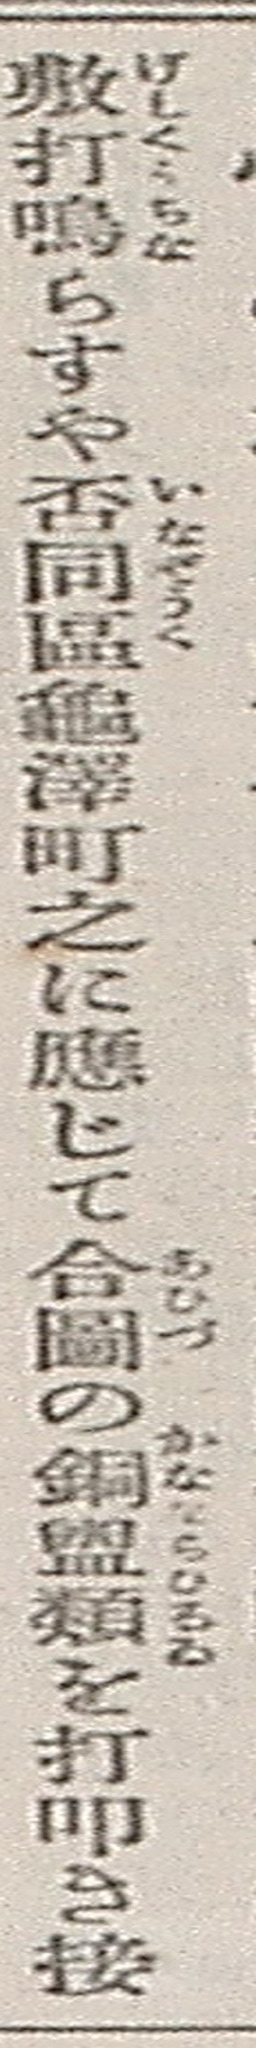敷打鳴らすや否同区亀沢町之に応じて合図の銅盥類を打叩き接
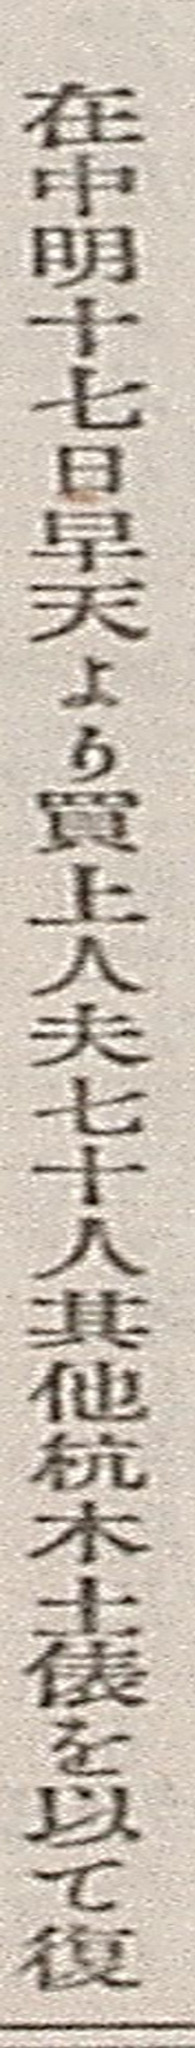在中明十七日早天より買上人夫七十人其他杭木土俵を以て復
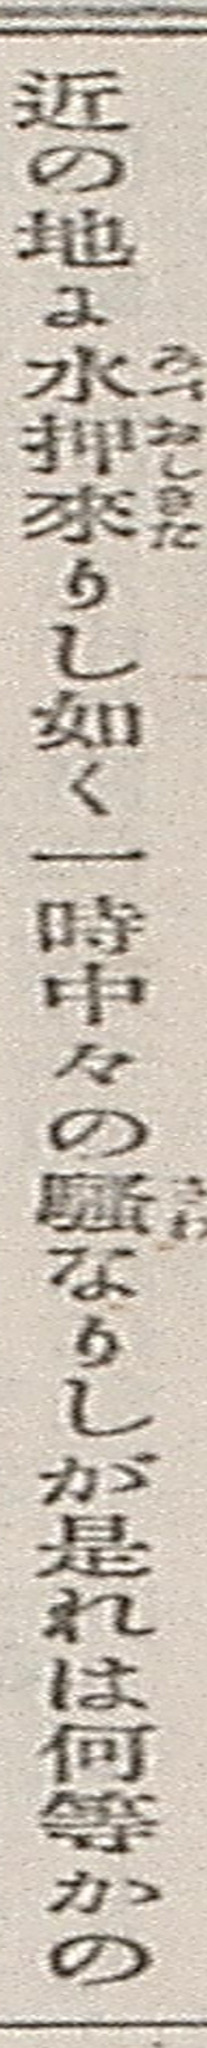近の地に水押来りし如く一時中々の騒なりしが是れは何等かの
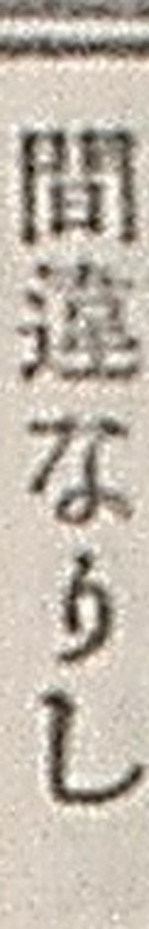間違なりし
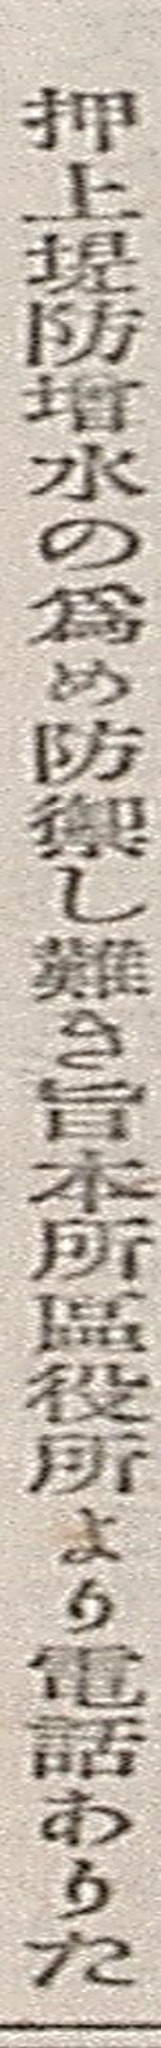押上堤防増水の為め防禦し難き旨本所区役所より電話ありた
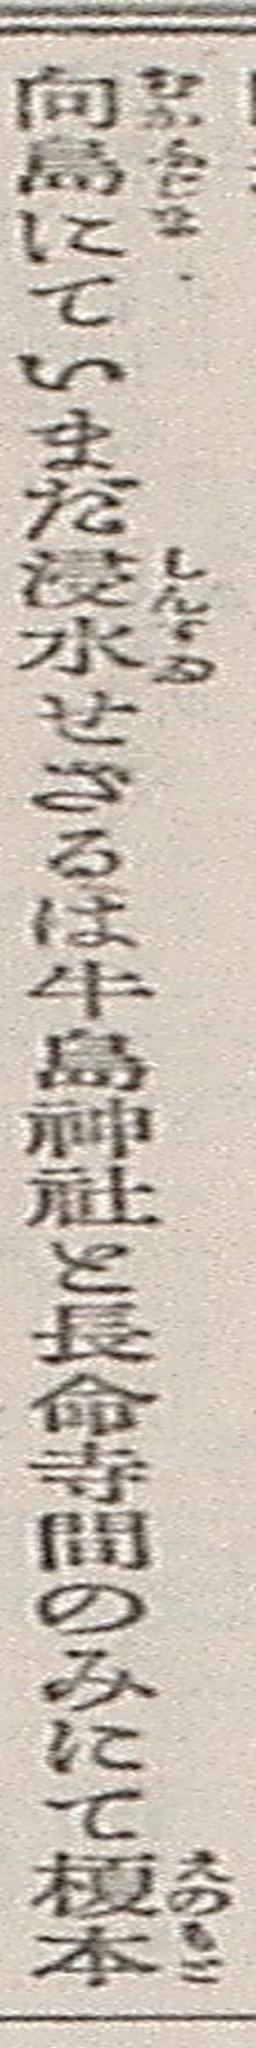向島にていまだ浸水せざるは牛島神社と長命寺間のみにて榎本
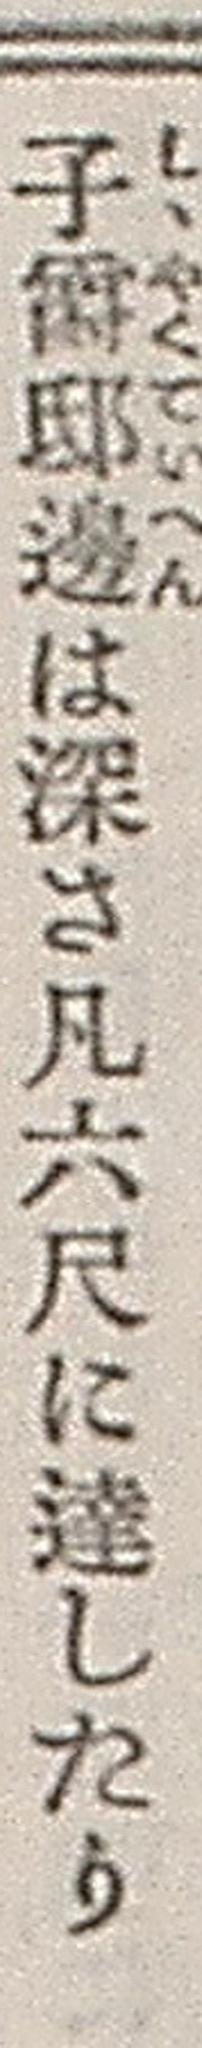子爵邸辺は深さ凡六尺に達したり
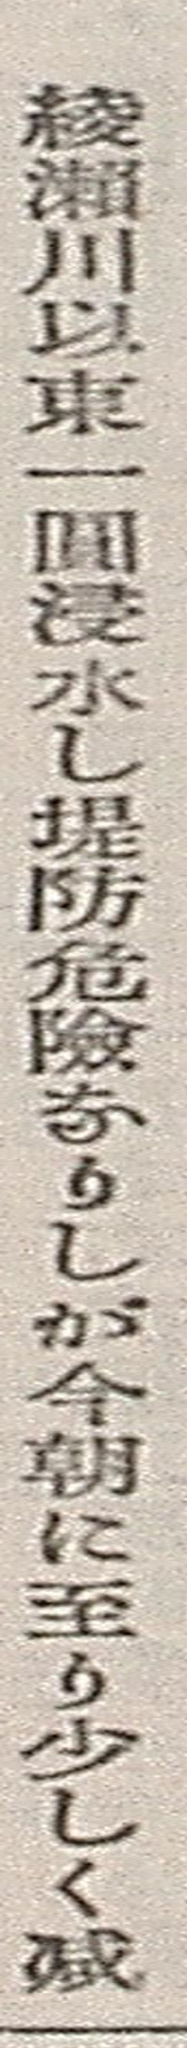綾瀬川以東一円浸水し堤防危険なりしが今朝に至り少しく減
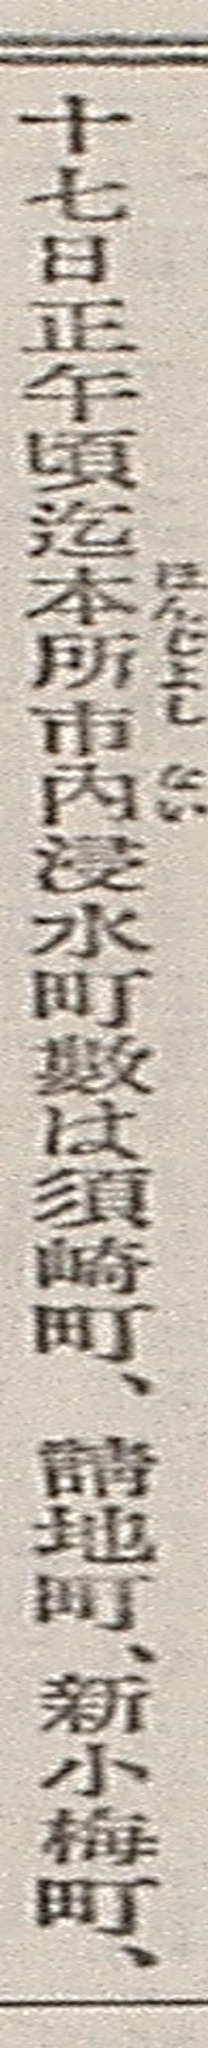十七日正午頃迄本所市内浸水町数は須崎町、請地町、新小梅町、
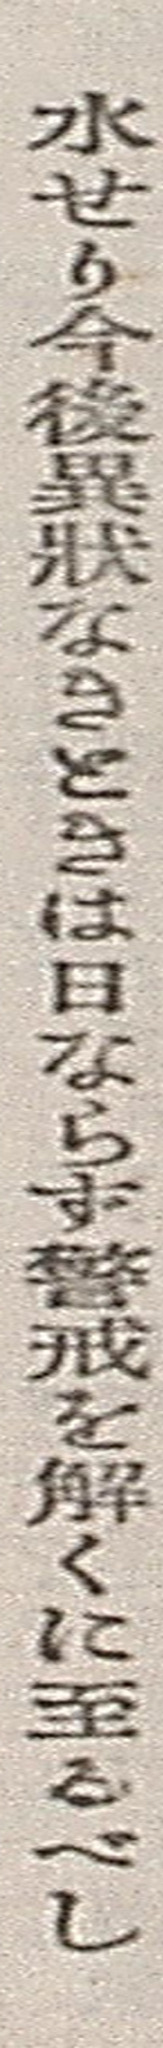水せり今後異状なきときは日ならず警戒を解くに至るべし
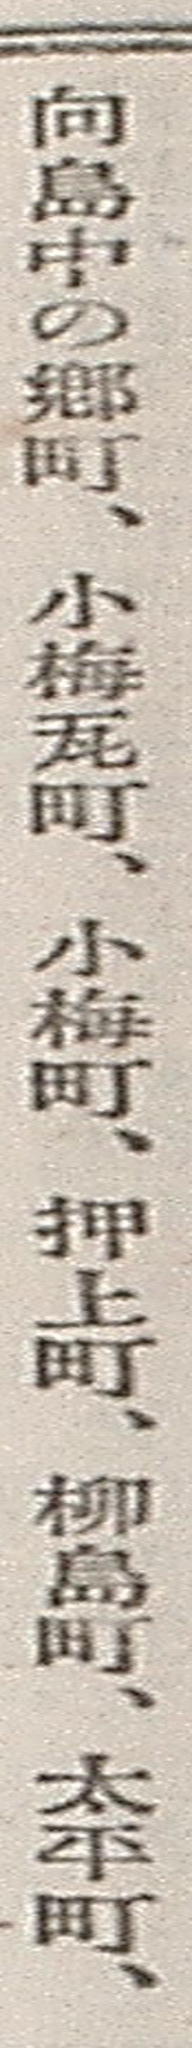向島中の郷町、小梅瓦町、小梅町、押上町、柳島町、太平町、
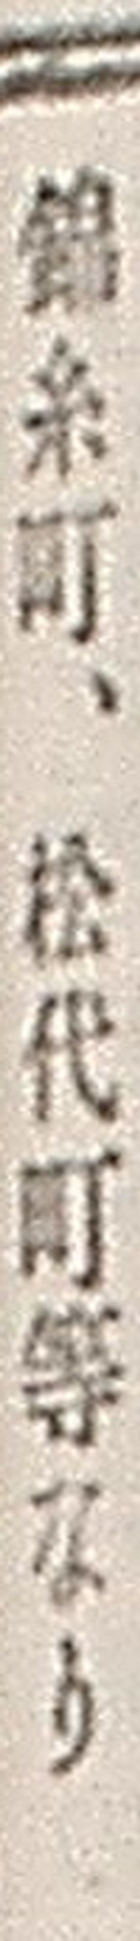錦糸町、松代町等なり
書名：風俗畫報臨時増刊第百二十四號　洪水地震被害録（上）
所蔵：東京大学地震研究所図書室 Earthquake Research Institute Library, The University of Tokyo, JAPAN
